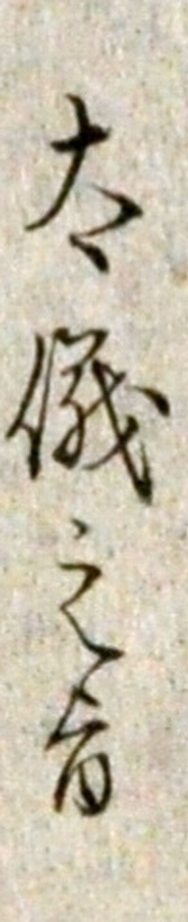太儀之旨
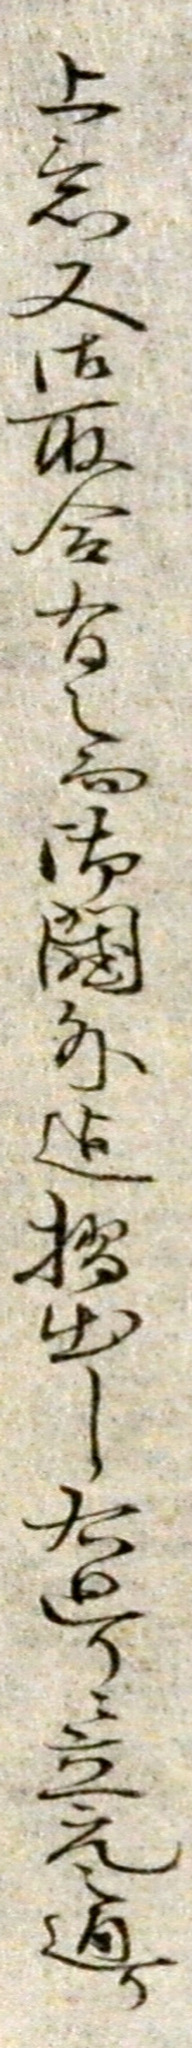上意又御取合有之而御閾外迄摺出し右廻りニ立元之通り
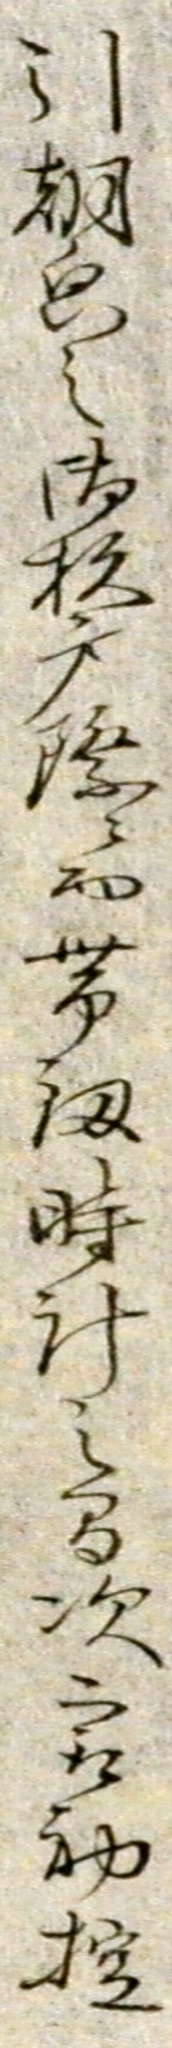引朝貌之御杉戸際ニ而帯釼時計之間次最初掟
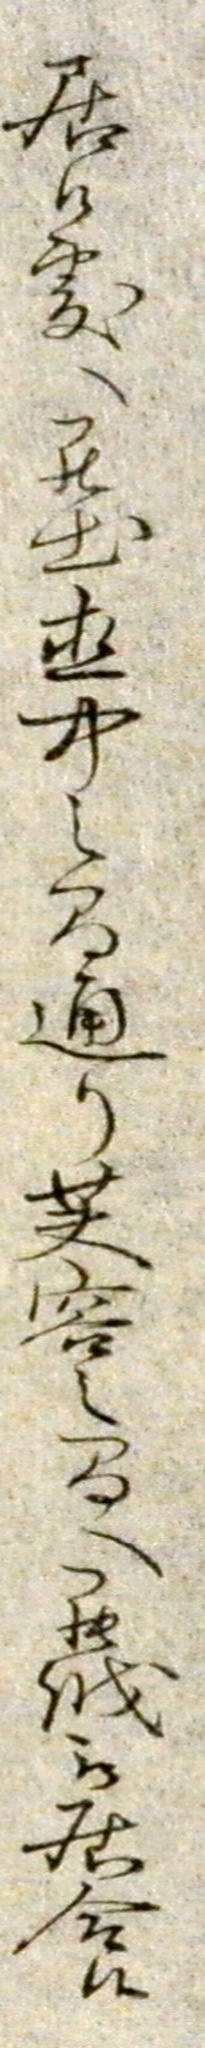居候処へ罷出直中之間通り芙蓉之間へ罷越被居合候
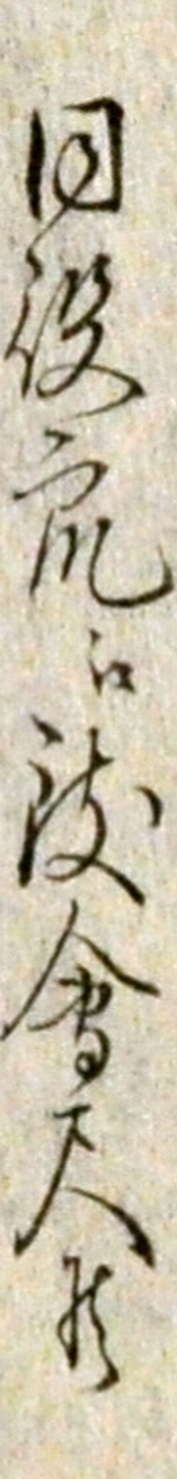同役衆江致会尺候
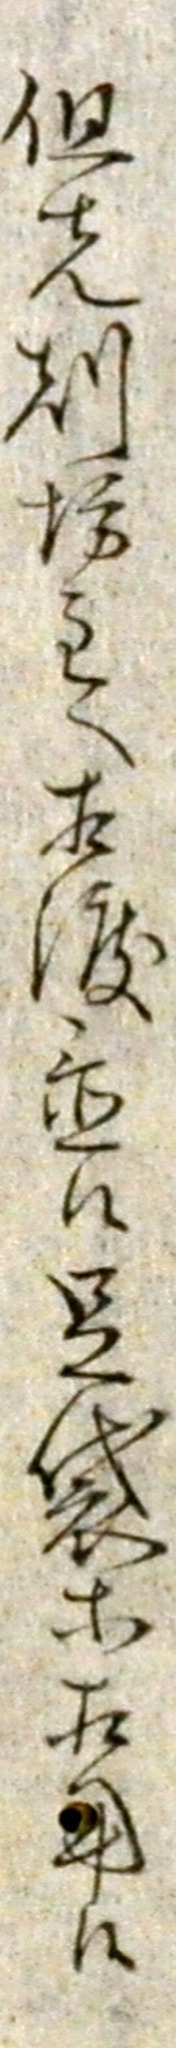但先刻坊主へ相渡置候足袋等相用候
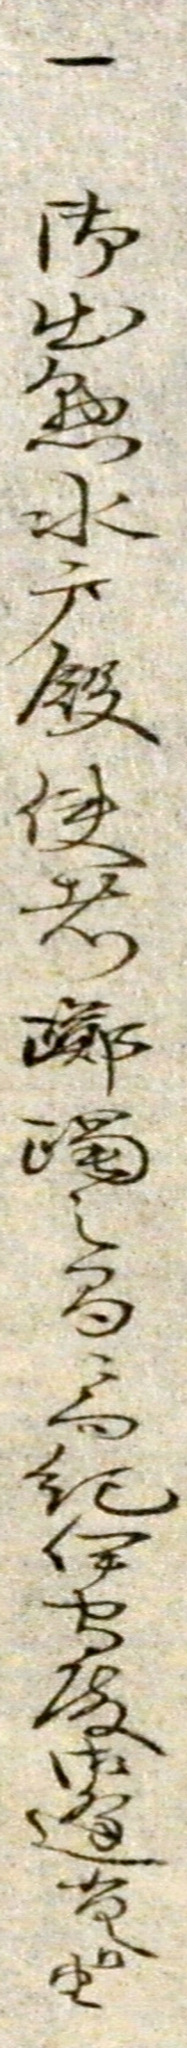一御出懸水戸殿使者躑躅之間ニ而紀伊守殿御逢有之候由
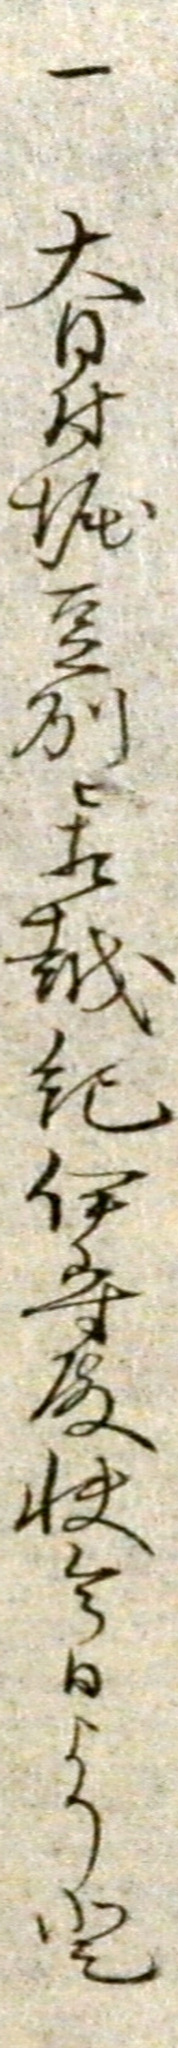一大目付堀豆州被相越紀伊守殿快今日より登
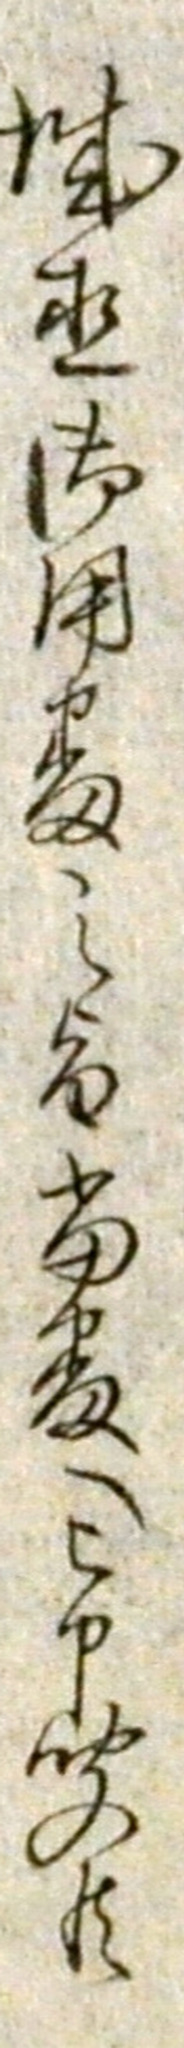城直御用番之旨当番へ被申聞候
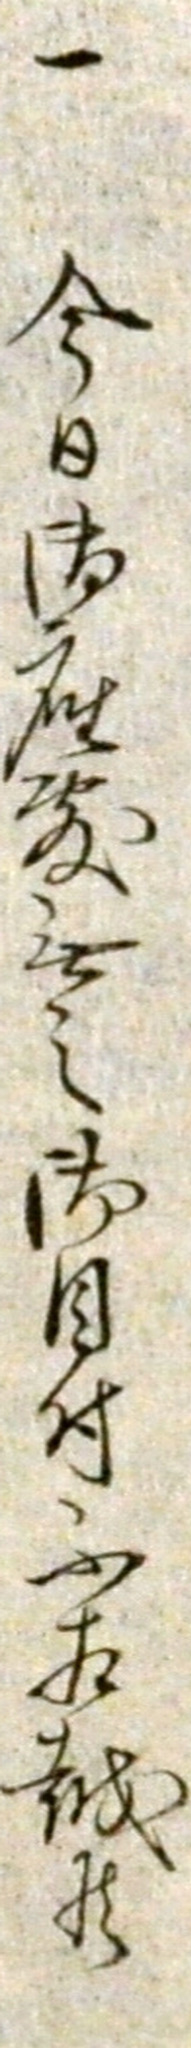一今日御座敷無之御目付不相越候
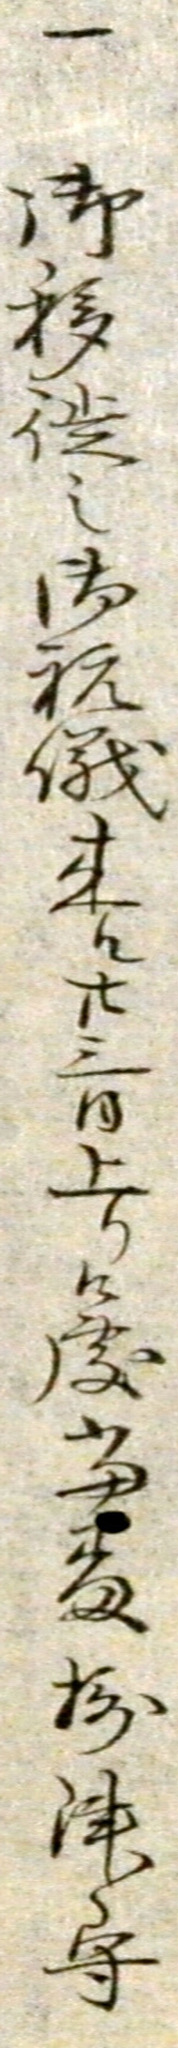一御移徙之御祝儀来ル廿三日上り候処当番摂津守
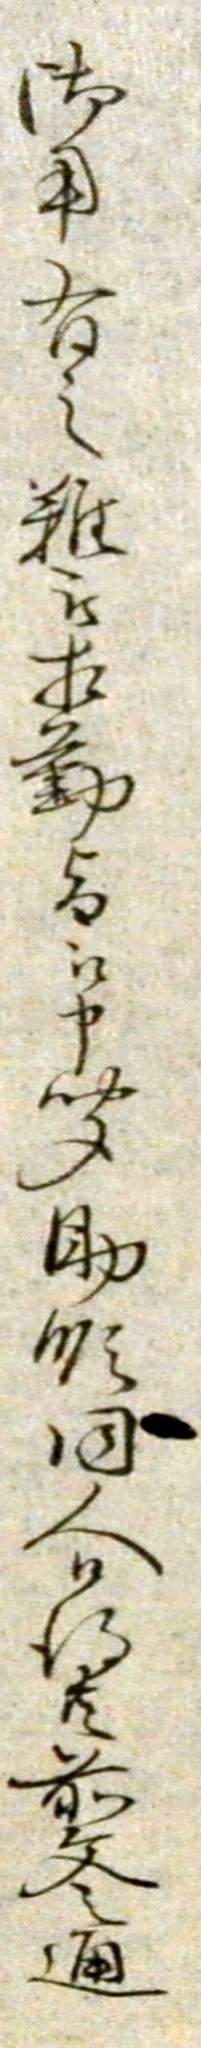御用有之難被相勤旨被申聞助順同人候得共前文之通
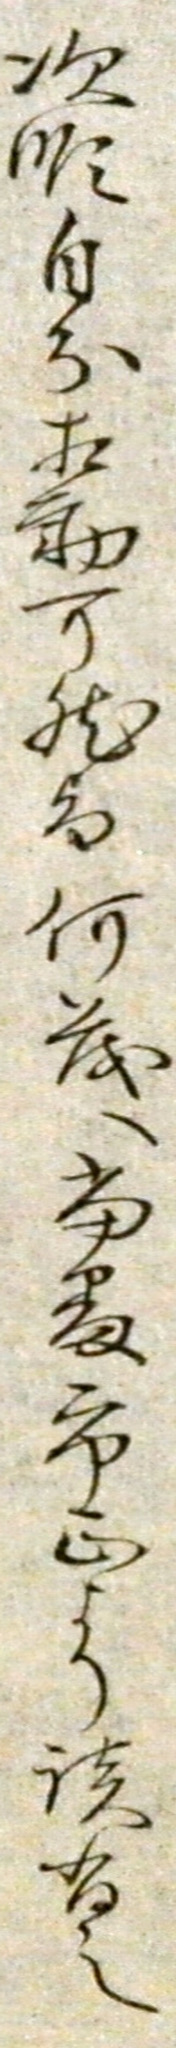次順自分相勤可然旨何もへ当番市正より談有之
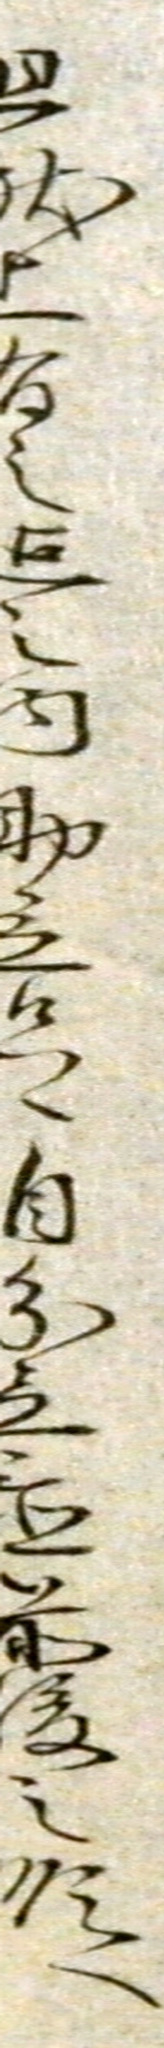且献上有之迄之内助立候はゝ自分立置前後之順へ

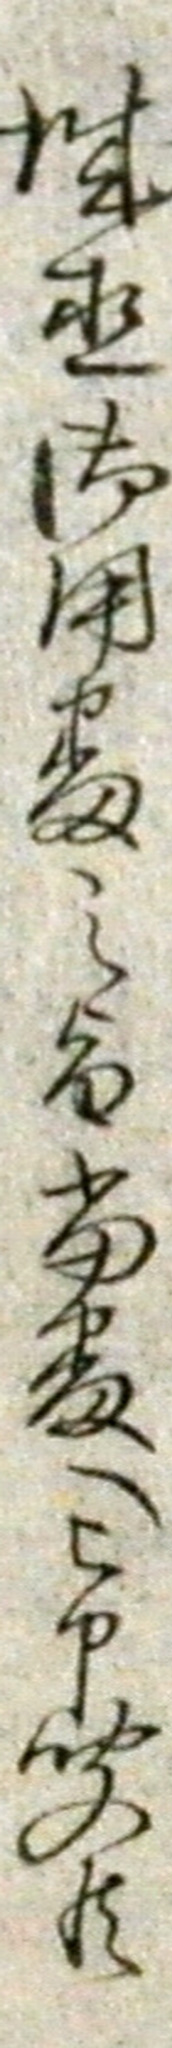城直御用番之旨当番へ被申聞候
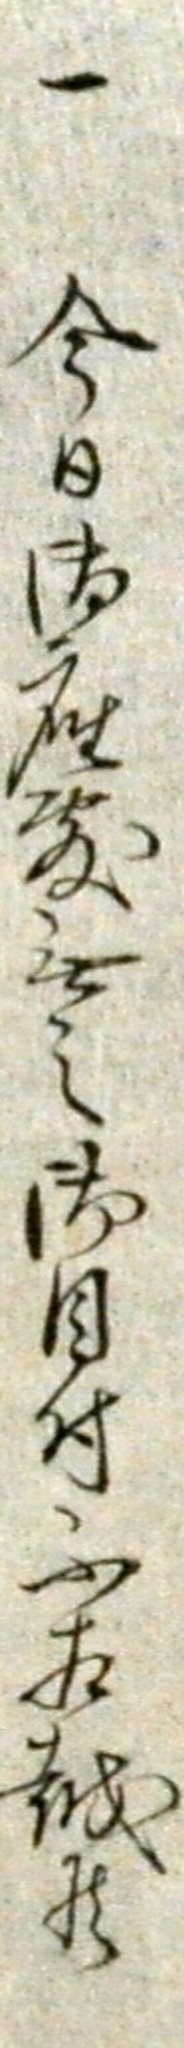一今日御座敷無之御目付不相越候
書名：日光御名代相勤候節ノ留
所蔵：伊那市立高遠町図書館・合同会社AMANE
